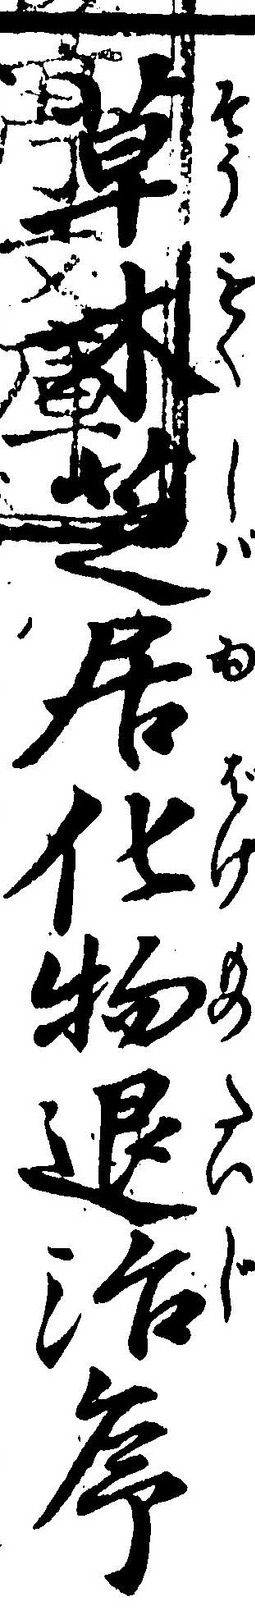草木芝居化物退治序
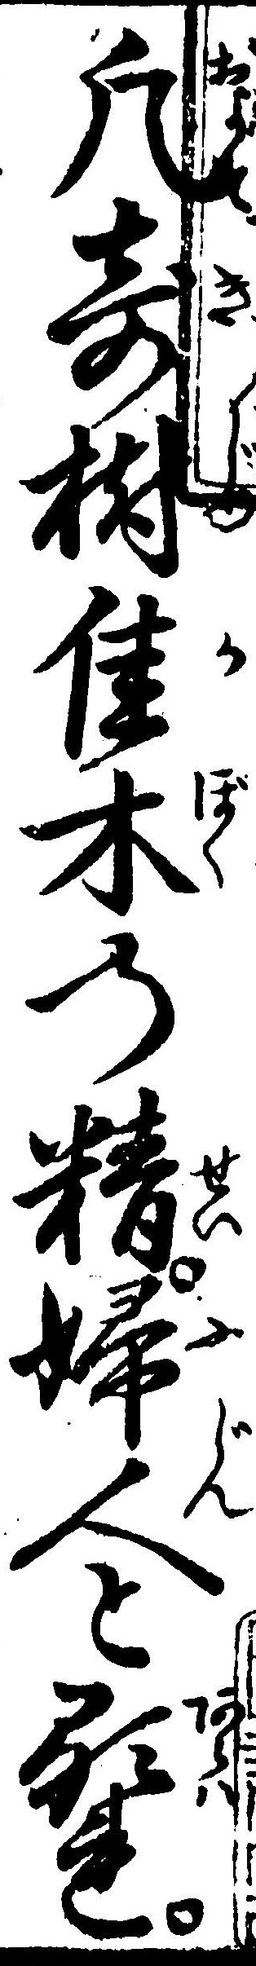凡奇樹佳木の精。婦人と顕れ。
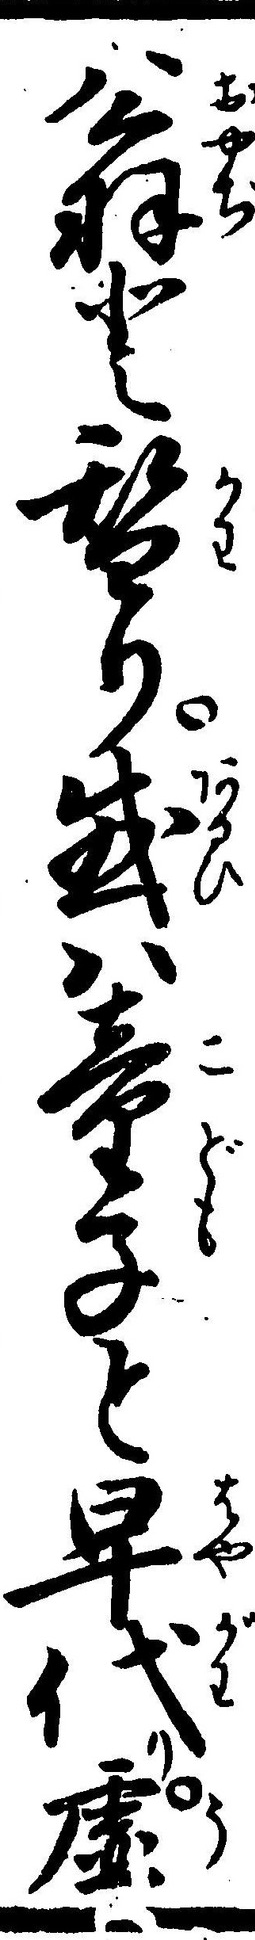翁と替り。或は童子と早代。虚
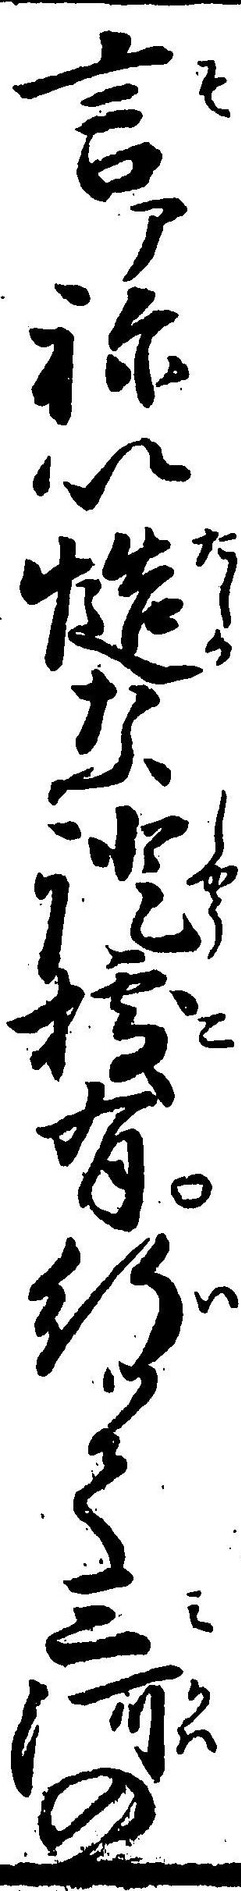言ァねい慥な証拠有。行三河の
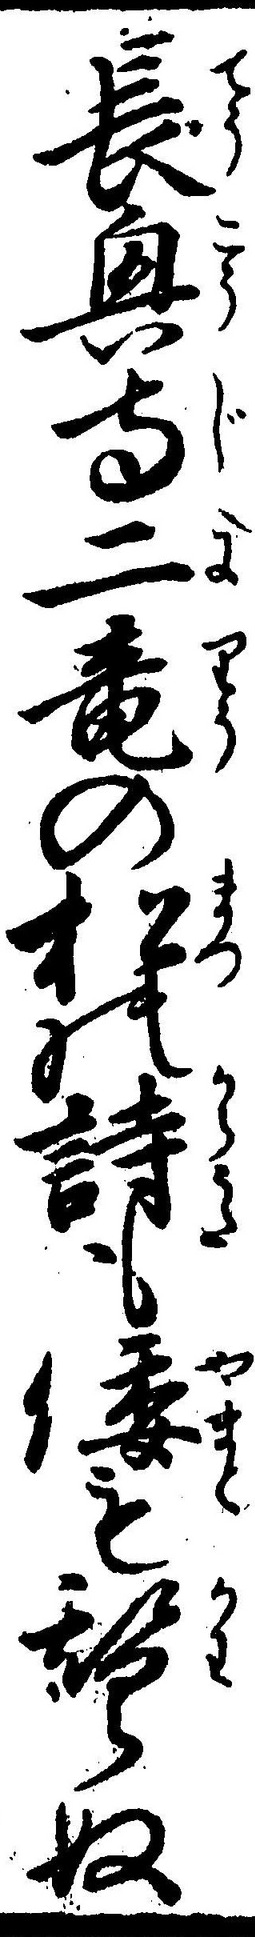長興寺二竜の松の詩も倭も替らぬ

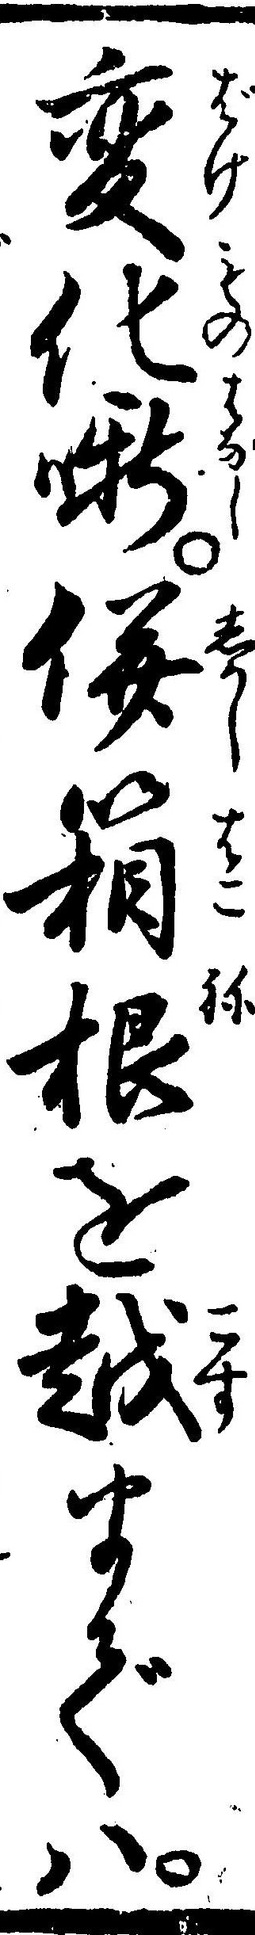変化噺。併箱根を越までは。
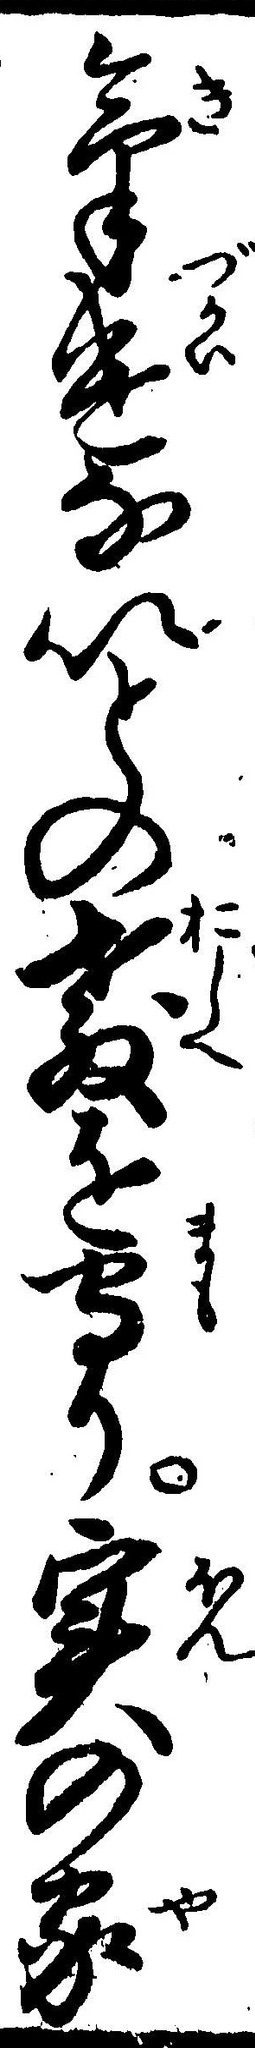気遣ないもの教を守り。実の家
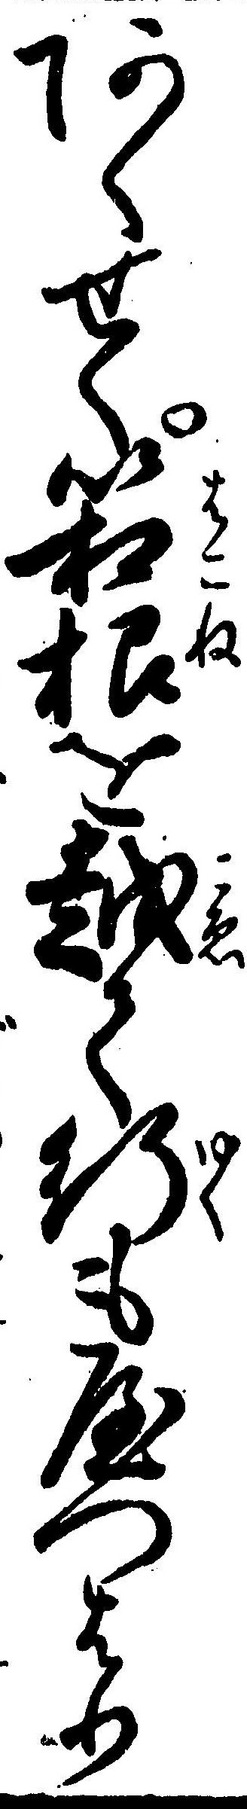あくせく。箱根を越て行もやつはり
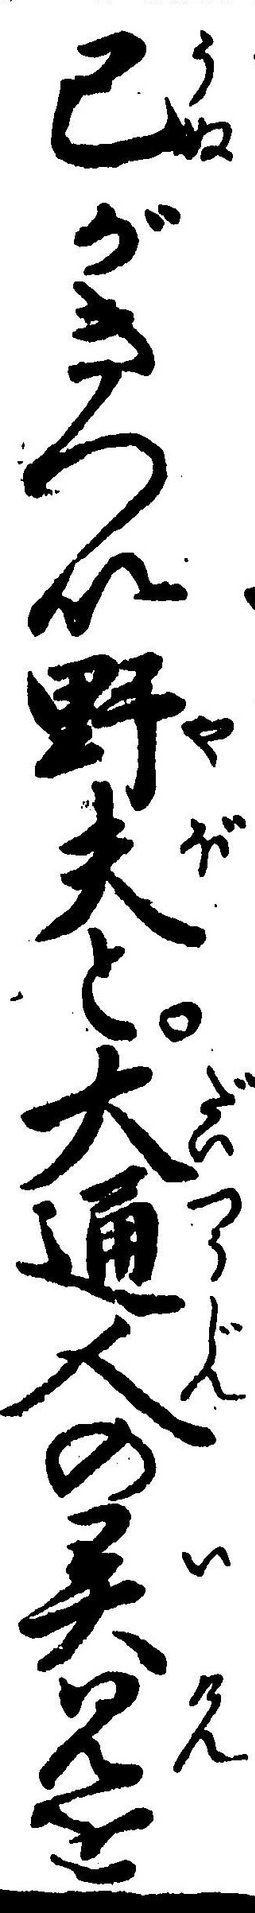己がきつい野夫と。大通人の異見を
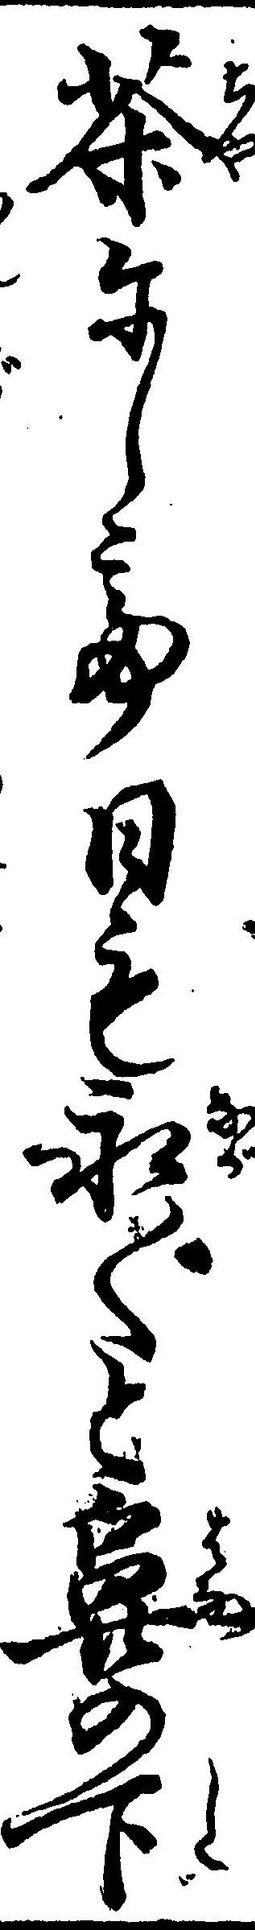茶にしみた目も永〳〵と鼻の下
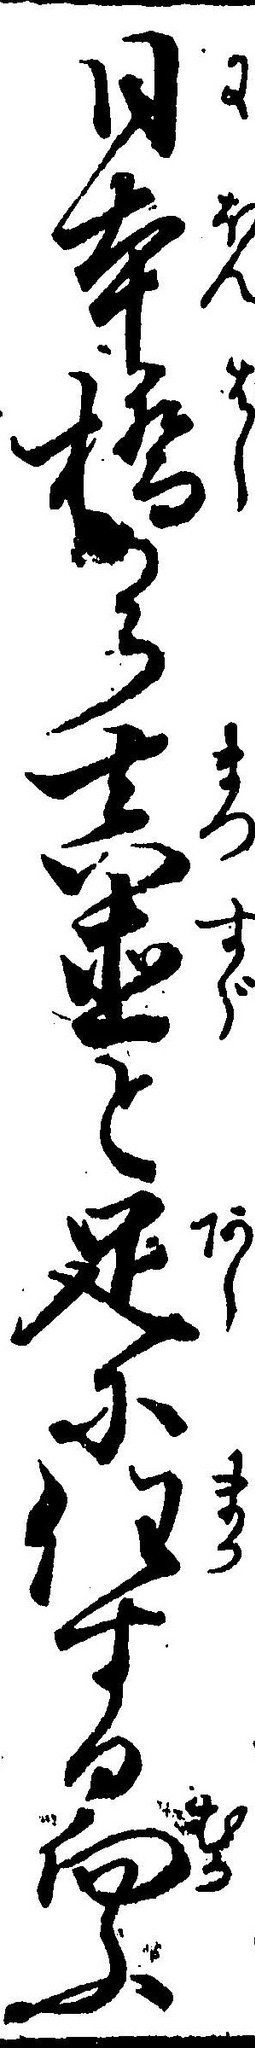日本橋から真直と足に任する向ふ
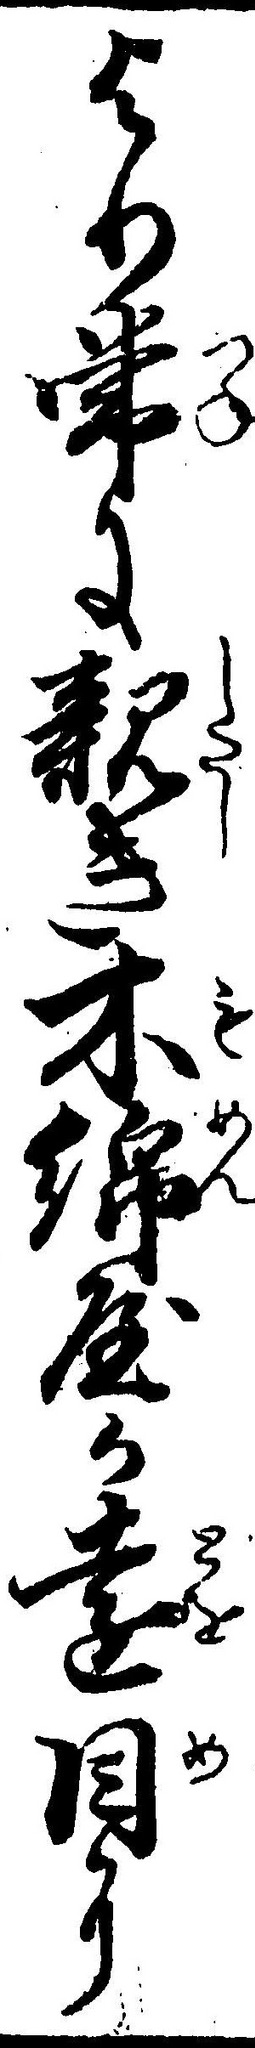より常に親き木綿屋か遠目に
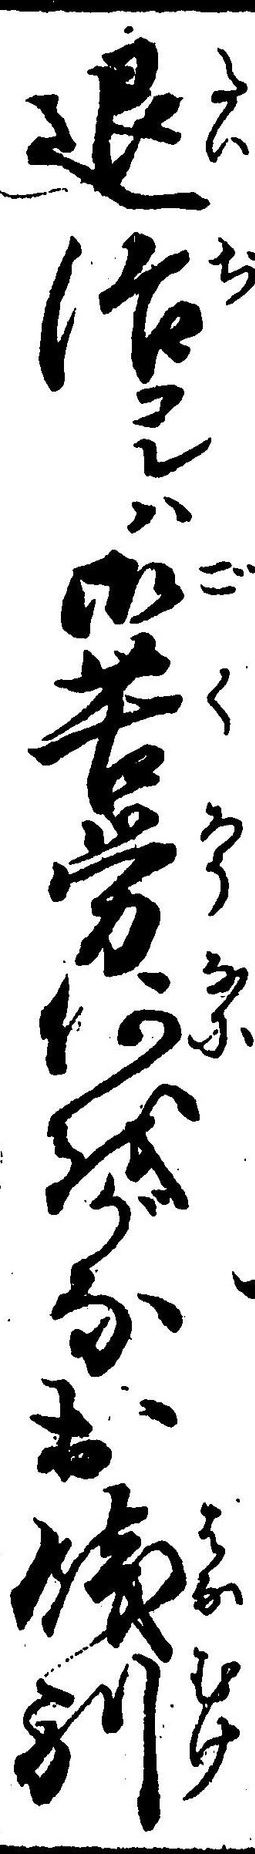退治コレハ御苦労何をがなお餞別

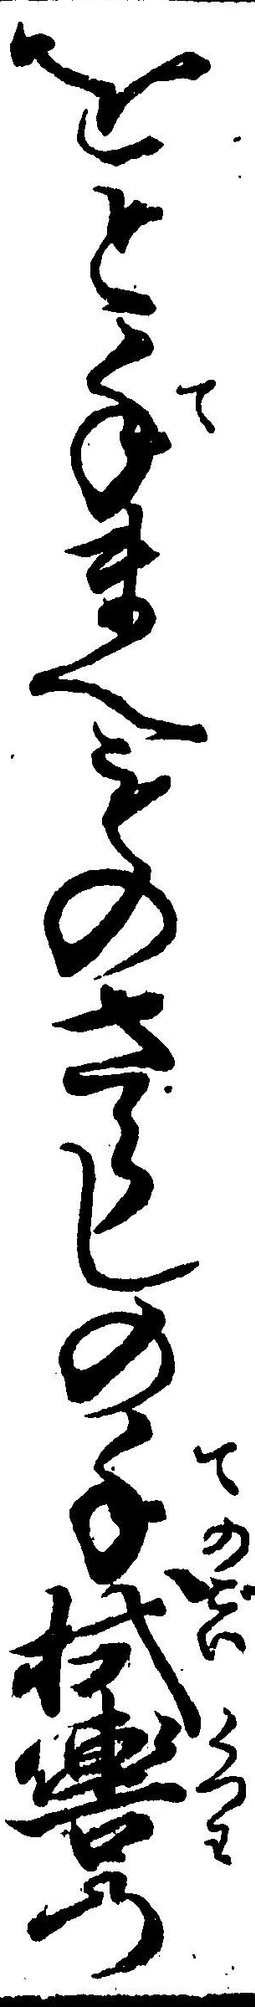をと手まへものさらしの手拭轡の
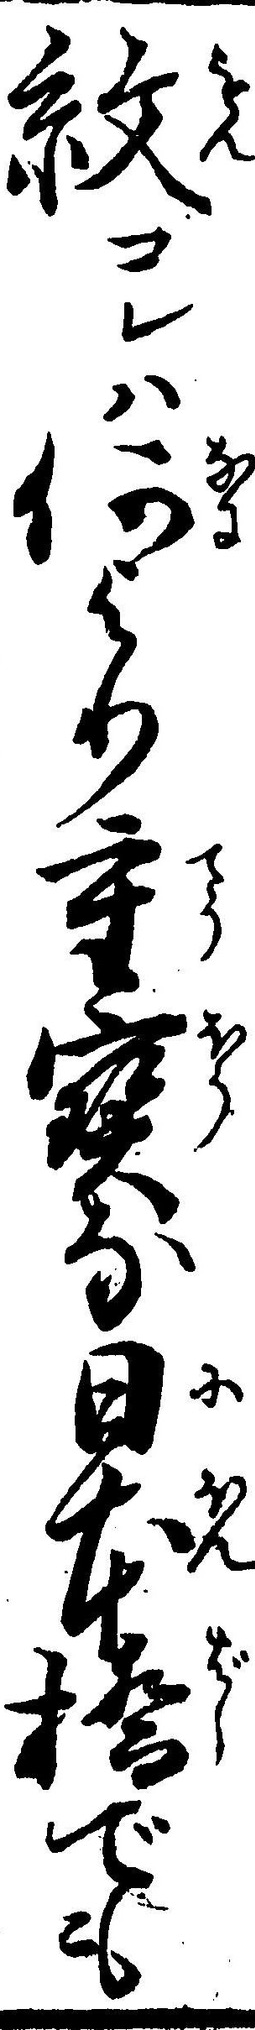紋コレハ何より重宝な日本橋でも
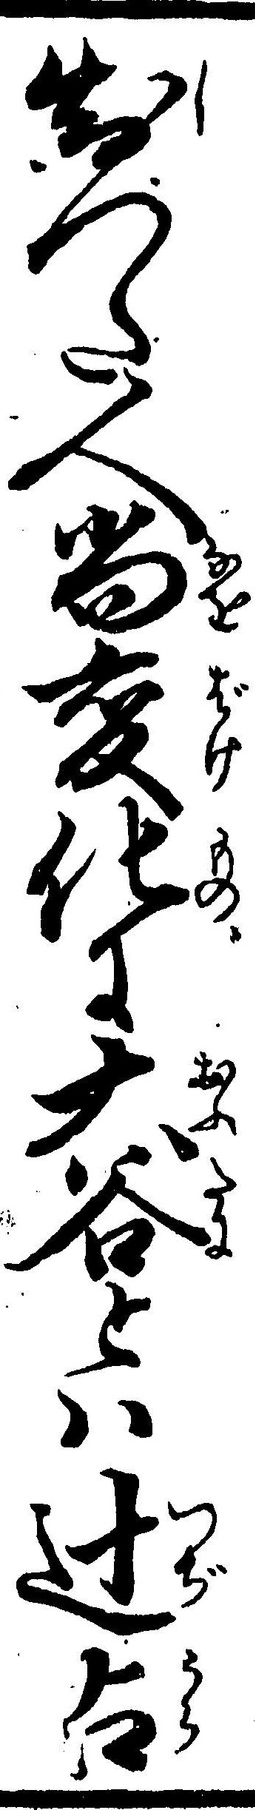知つた人尚変化に大谷とは辻占
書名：草木芝居化物退治 / 泉花堂三蝶(十六兵衛)作
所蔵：東京大学総合図書館 General Library in the University of Tokyo, JAPAN
